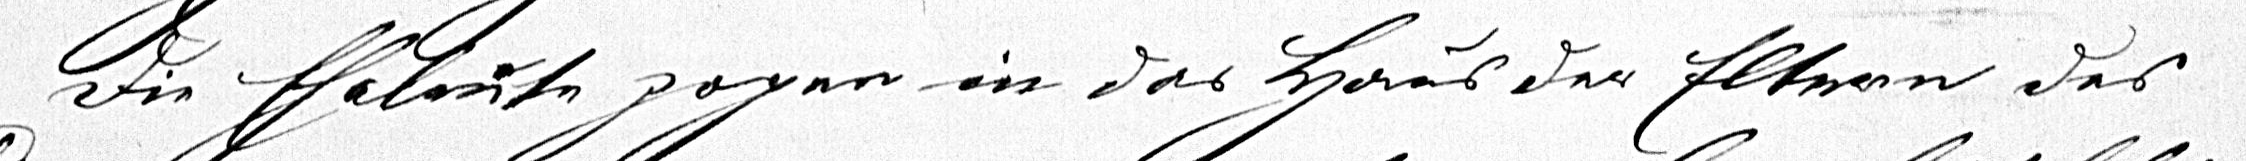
Die Eheleute zogen in das Haus der Eltern des
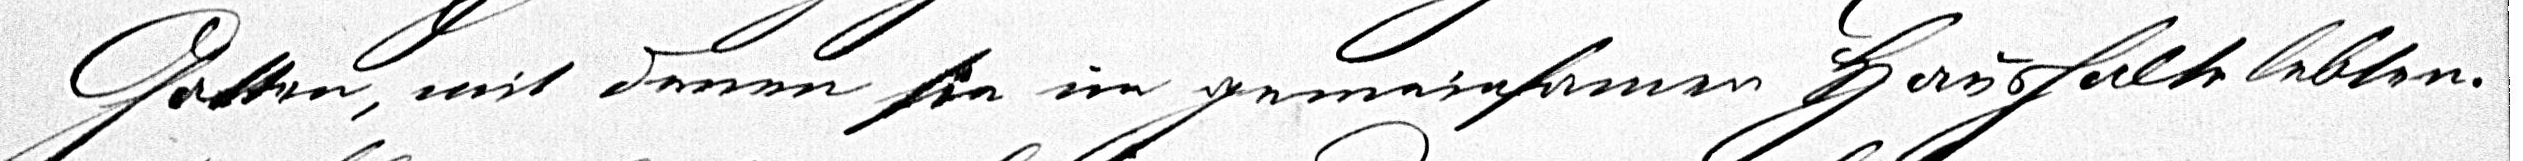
Gatten, mit denen sie im gemeinsamen Haushalte lebten.
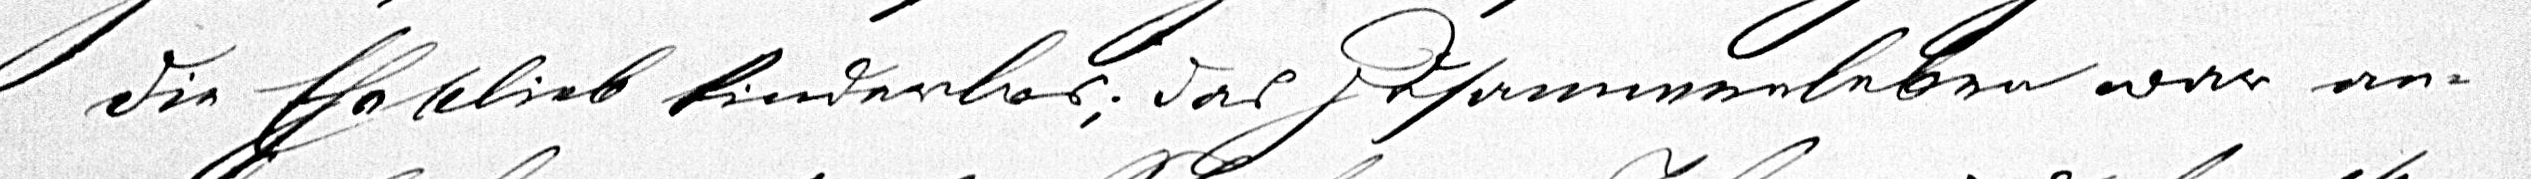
Die Eheblieb kinderlos; das Zusammenleben war an¬
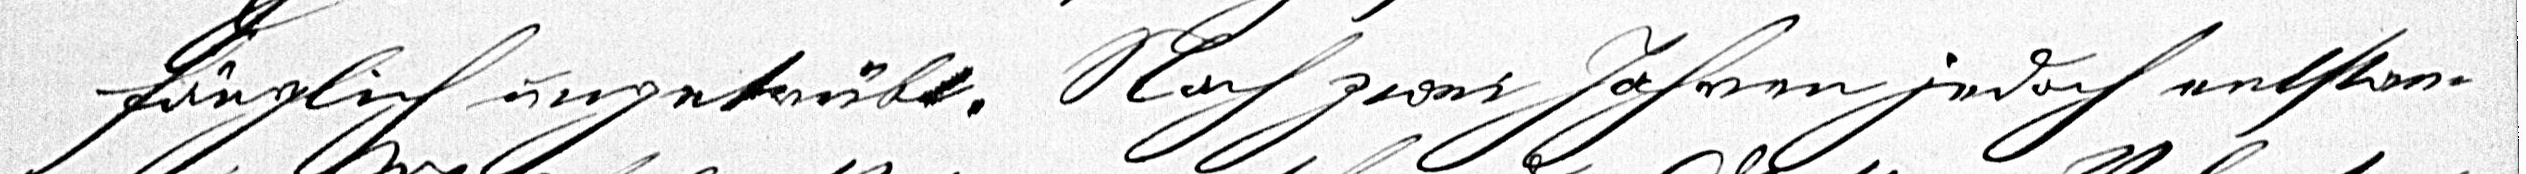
fänglich ungetrübt. Nach zwei Jahren jedoch entstan¬
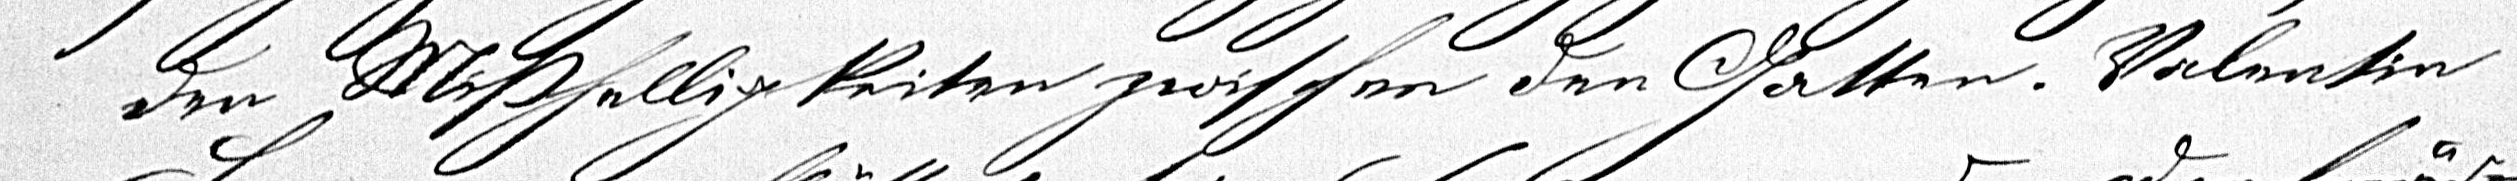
den Mißhelligkeiten zwischen den Gatten. Valentin
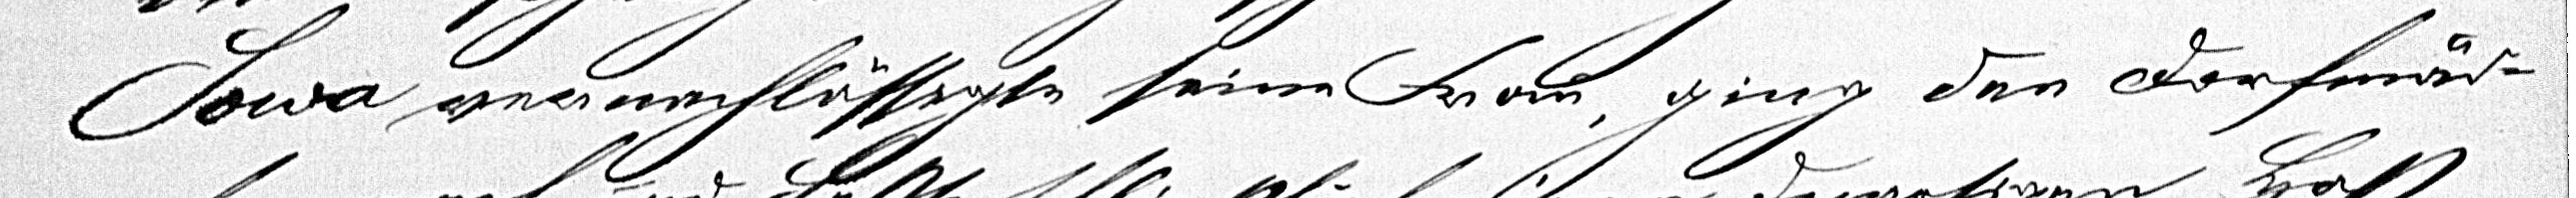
Sowa vernachlässigte seine Frau, ging den Dorfmäd¬
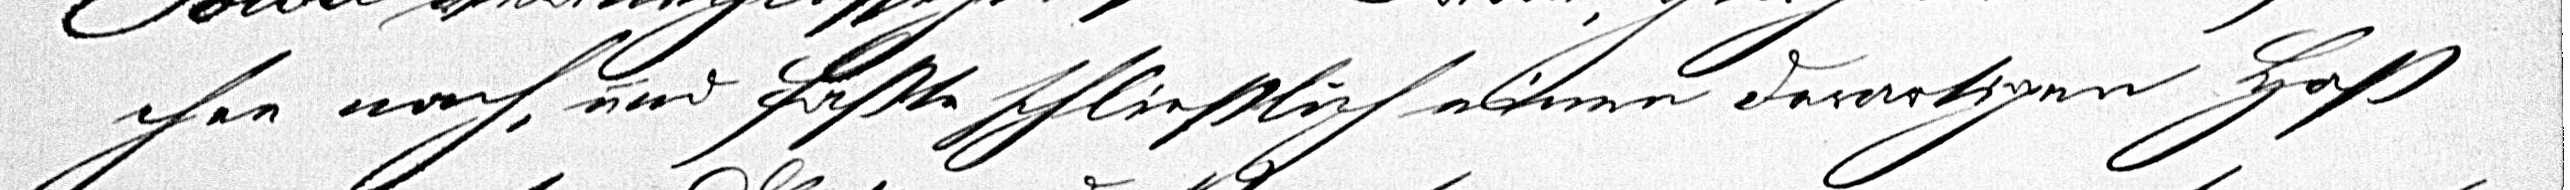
chen nach, und faßte schließlich einen derartigen Haß
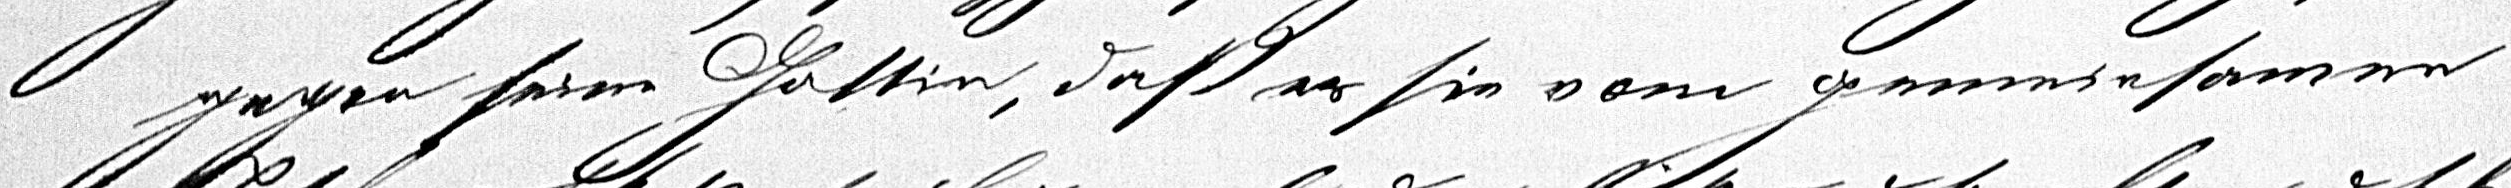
gegen seine Gattin, daß er sie vom gemeinsamen
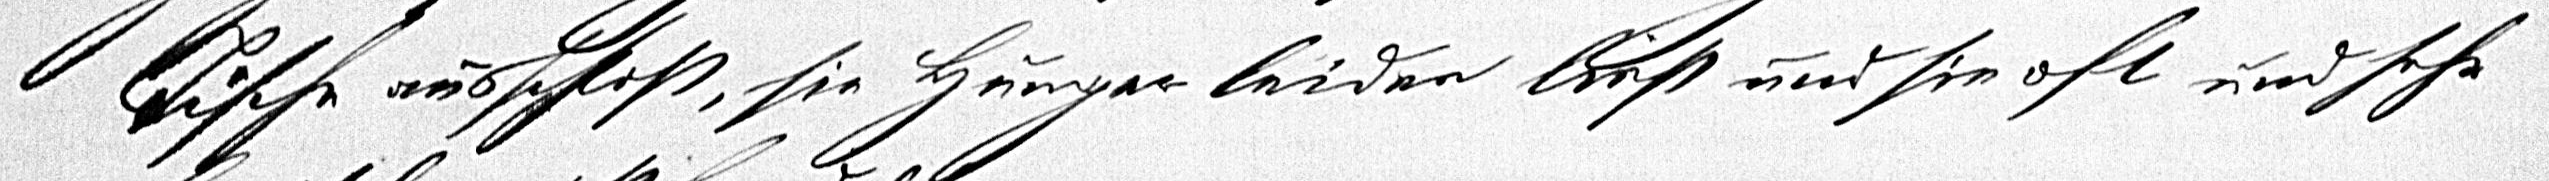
Tische ausschloß, sie Hunger leiden ließ und sie oft und sehr
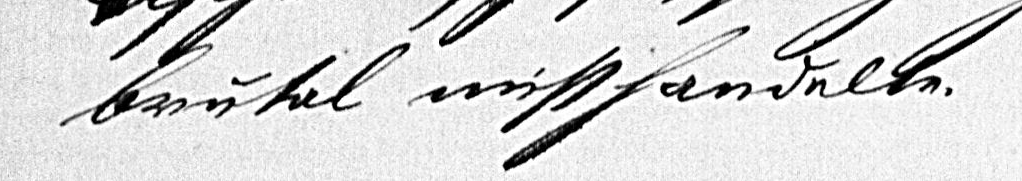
brutal mißhandelte.
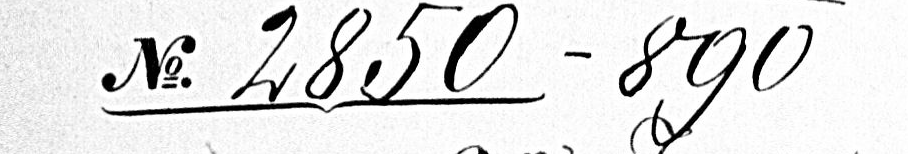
Nr. 2850-890
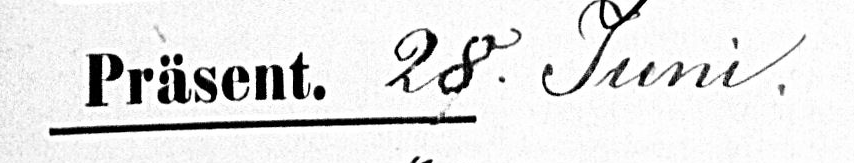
Präsent. 28. Juni.
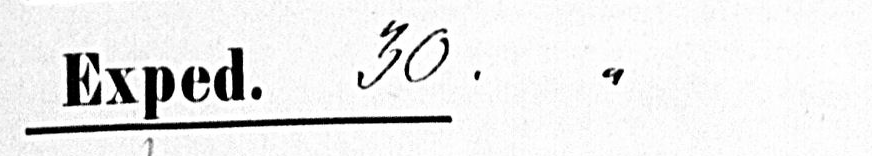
Exped. 30. Juni.
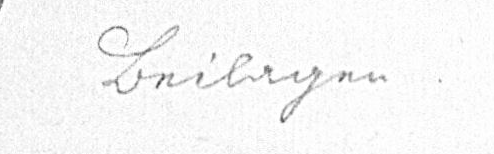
Beilagen
